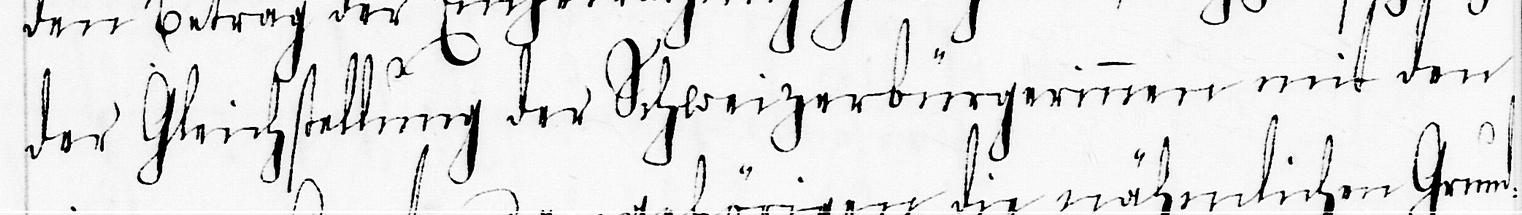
der Gleichstellung der Schweizerbürgerinnen mit den
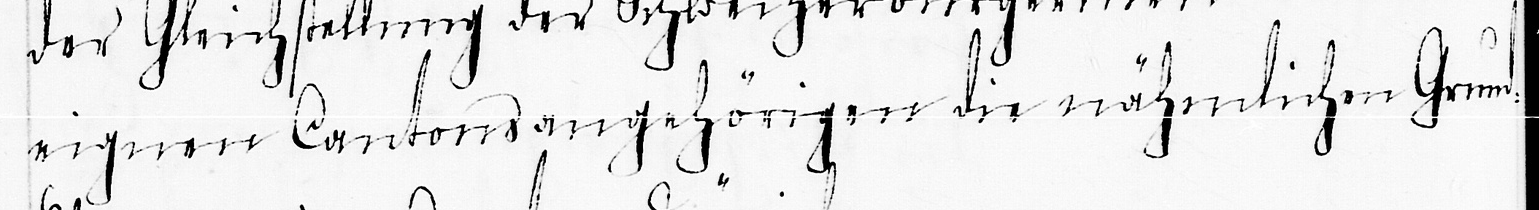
eignen Cantonsangehörigen die nähmlichen Grund¬
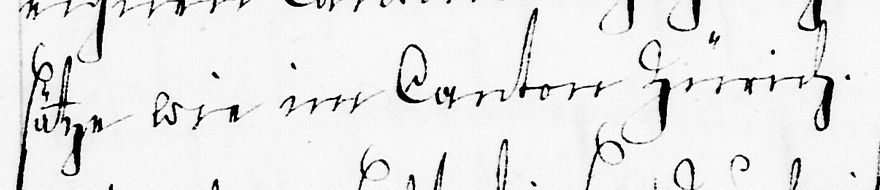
sätze wie im Canton Zürich.
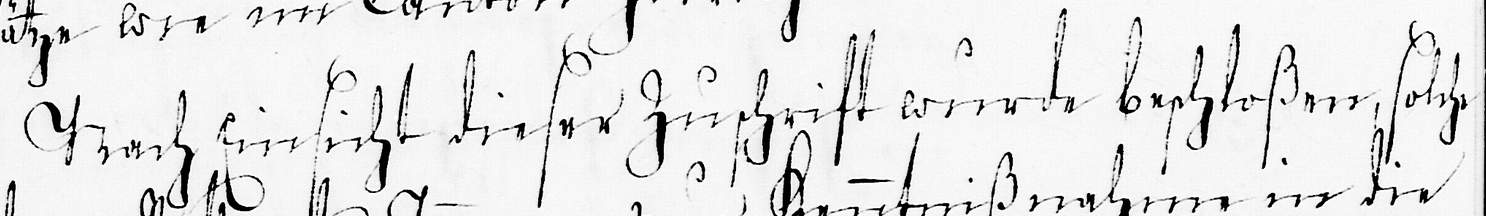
Nach Einsicht dieser Zuschrift wurde beschloßen, so¬
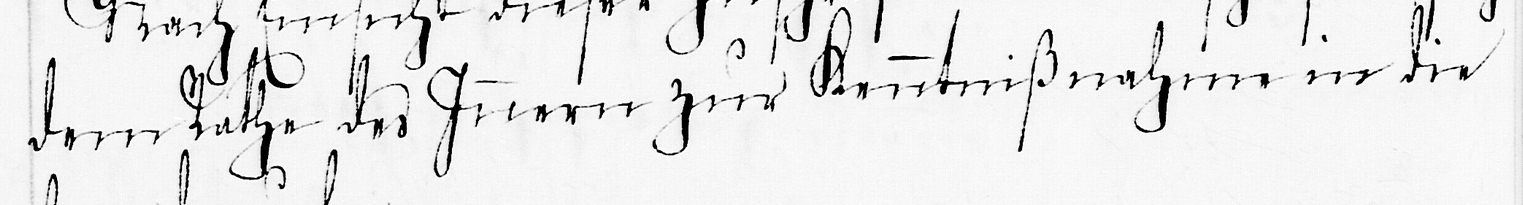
dem Rathe des Innern zur Kenntnißnahme in die
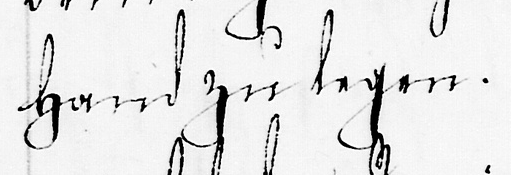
Hand zu legen.
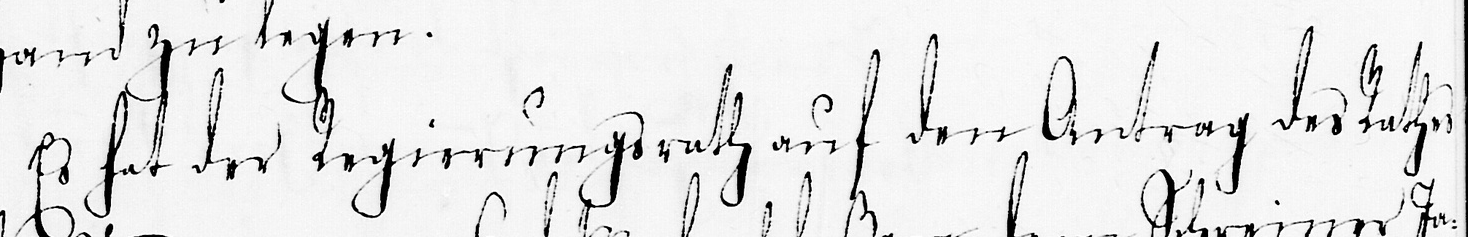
Es hat der Regierungsrath auf den Antrag des Rath¬
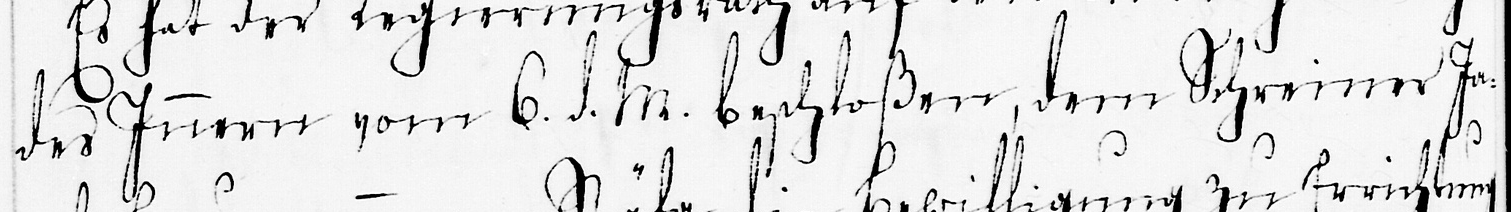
des Innern vom 6. d. M. beschloßen, dem Schreiner Ja¬
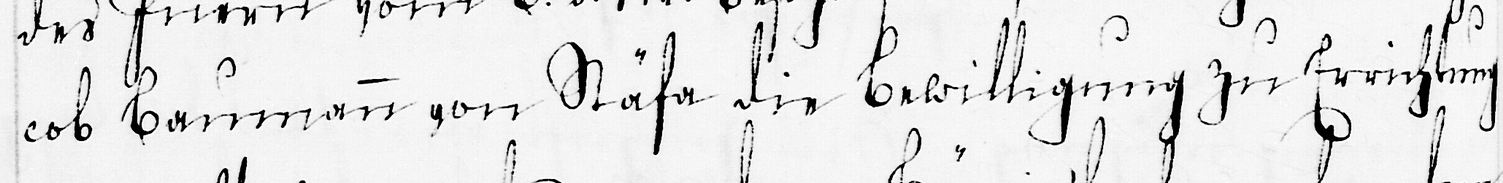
cob Baumann von Stäfa die Bewilligung zu Errichtung
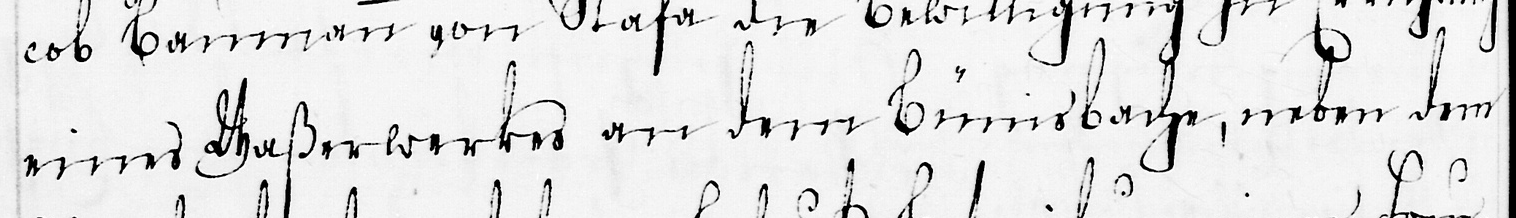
eines Waßerwerkes an dem Bünisbache, neben dem
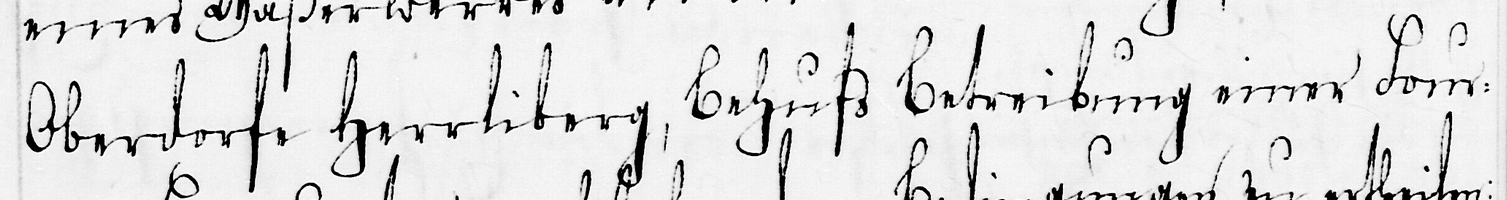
Oberdorfe Herrliberg, Behufs Betreibung einer Four¬
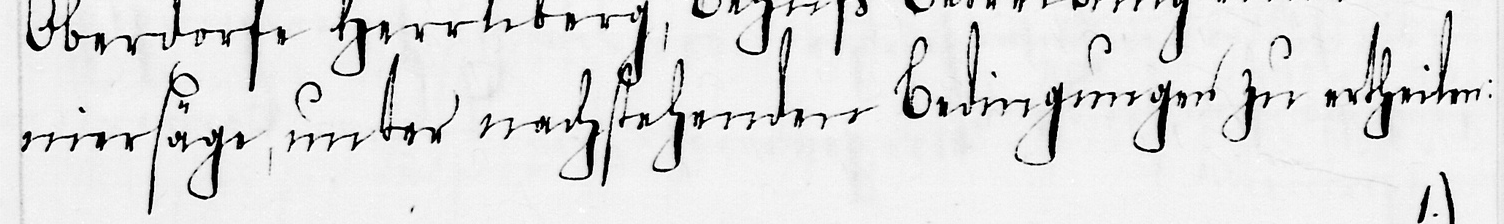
niersäge, unter nachstehenden Bedingungen zu ertheile¬
